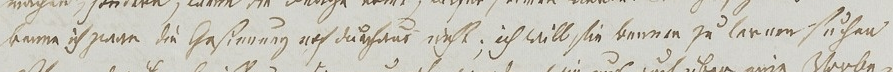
kenne ich zwar die Gesinnung noch durchaus nicht; ich will sie kennen zu lernen suchen
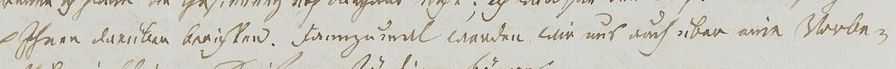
& Ihnen darüber berichten. Dannzumal werden wir uns auch über eine Vorbe-
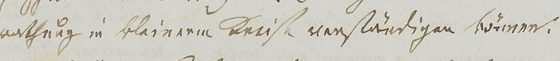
rathung in kleinerm Kreise verständigen können.
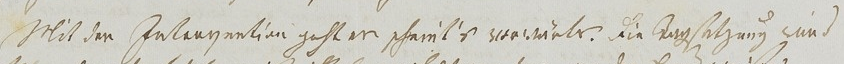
Mit der Intervention geht es scheint's vorwärts. Die Tagsatzung wird
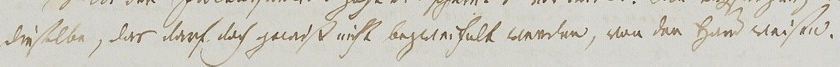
dieselbe, das darf doch gewiß nicht bezweifelt werden, von der Hand weisen.
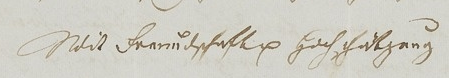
Mit Freundschaft & Hochschätzung
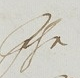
Ihr
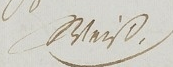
Weiß.
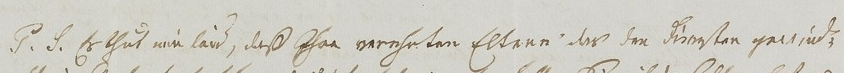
P. S. Es thut mir leid, daß Ihre verehrten Eltern das den Diensten gewied-
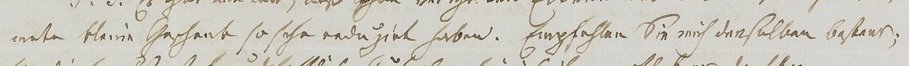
mete kleine Geschenk so sehr reduzirt haben. Empfehlen Sie mich denselben bestens;
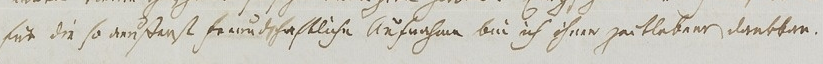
für die so aeußerst freundschaftliche Aufnahme bin ich ihnen zeitlebens dankbar.
